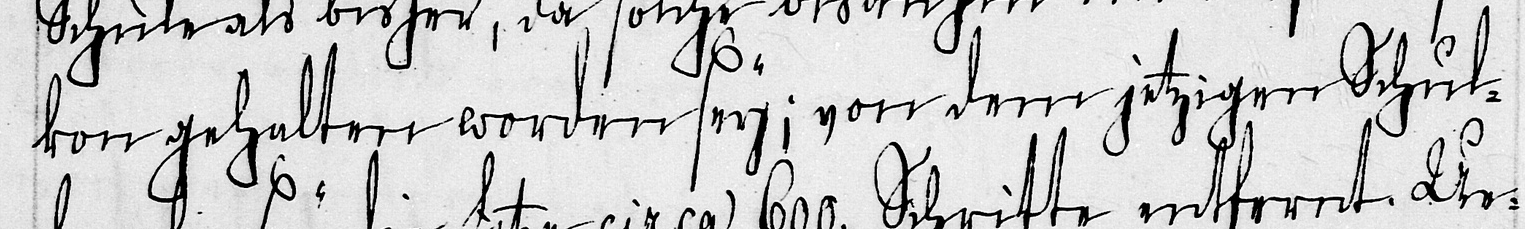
kon gehalten worden sey; von dem jetzigen Schul¬
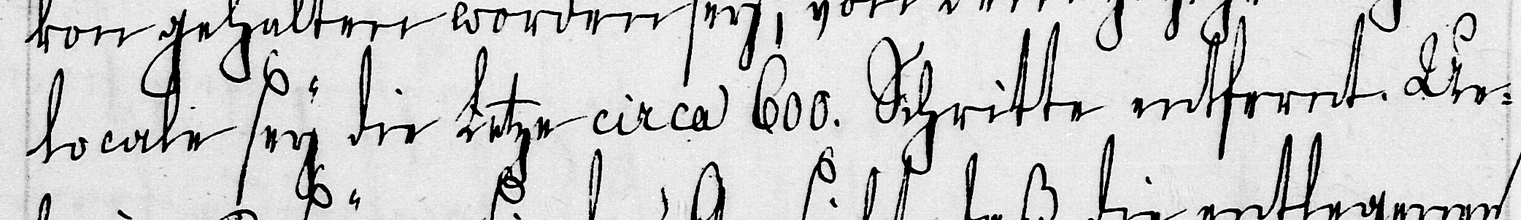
locale sey die Letze circa 600. Schritte entfernt. Ue¬
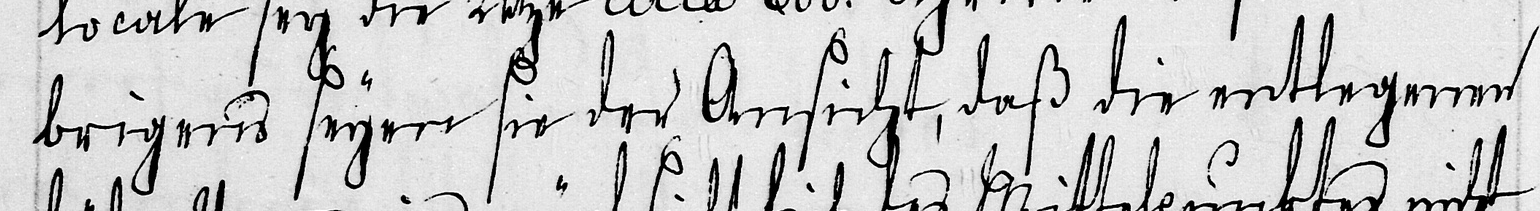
brigens seyen sie der Ansicht, daß die entlegenen
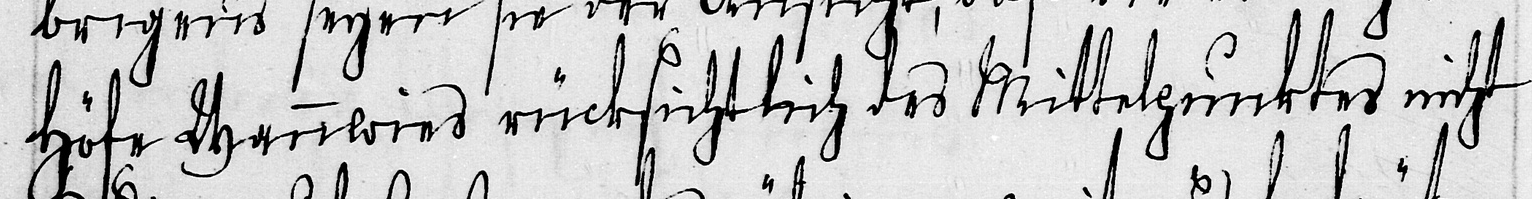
Höfe Wannwies rücksichtlich des Mittelpunktes nicht
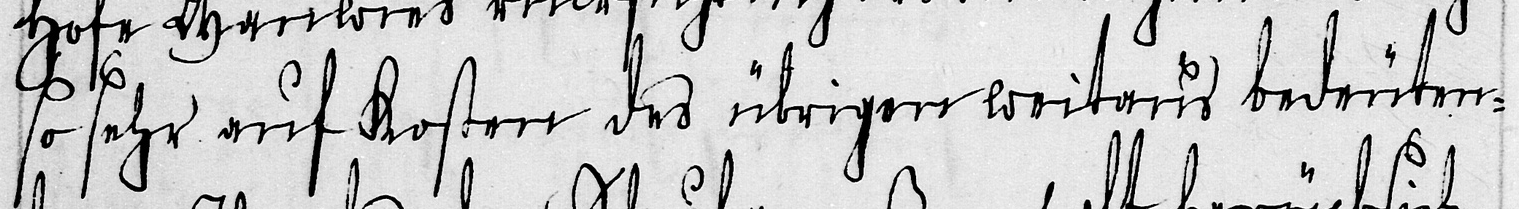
so sehr auf Kosten des übrigen weitaus bedeuten¬
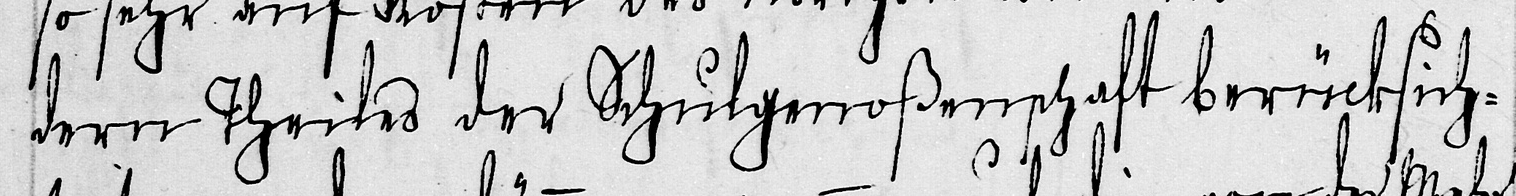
dern Theiles der Schulgenoßenschaft berücksich¬
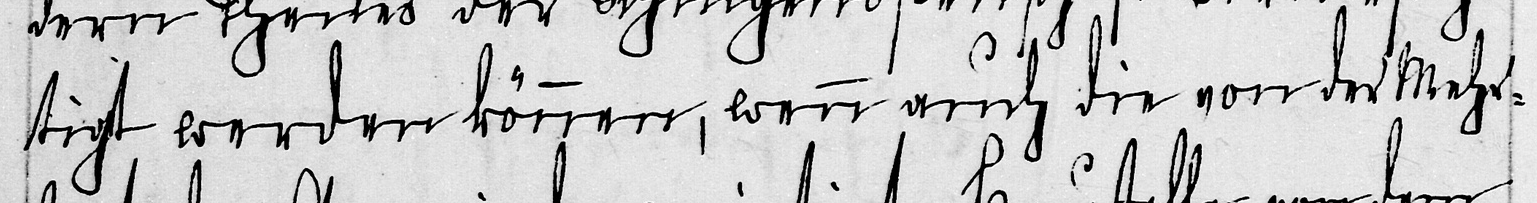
tigt werden können, wenn auch die von der Mehr¬
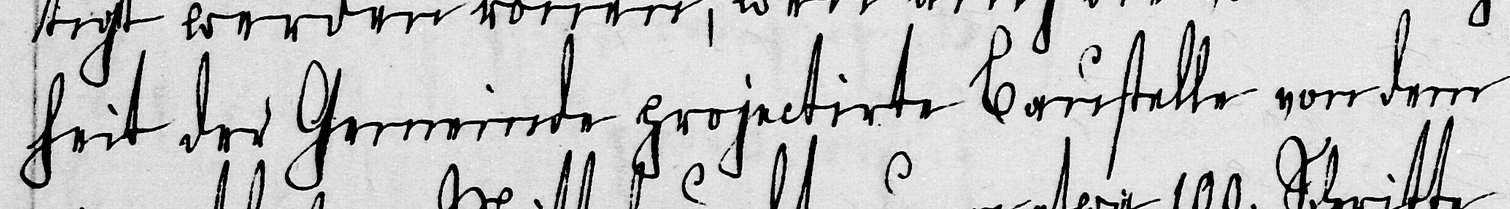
heit der Gemeinde projectirte Baustelle von dem
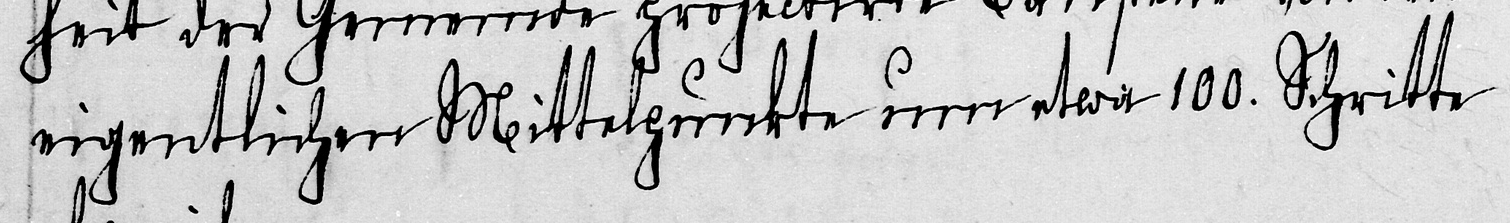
eigentlichen Mittelpunkte um etwa 100. Schritte
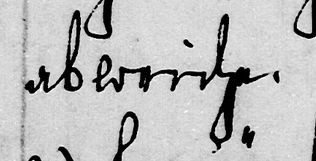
abweiche.
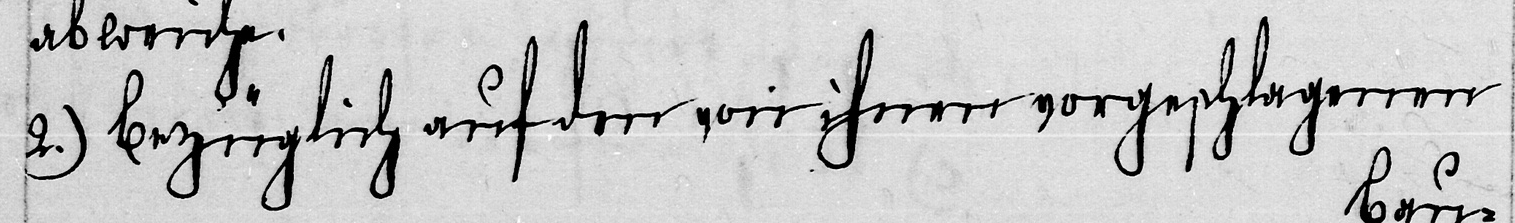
2.) Bezüglich auf den von ihnen vorgeschlagenen
